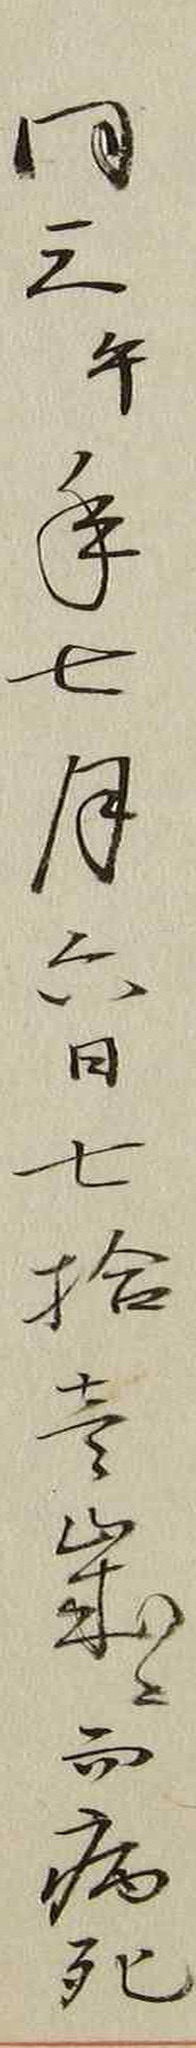一同三午年七月六日七拾壱歳ニ而病死
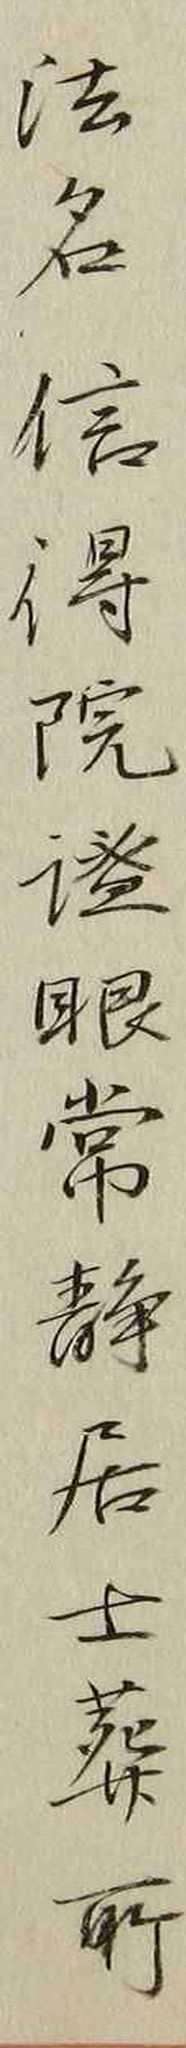法名信得院謐眼常静居士葬所
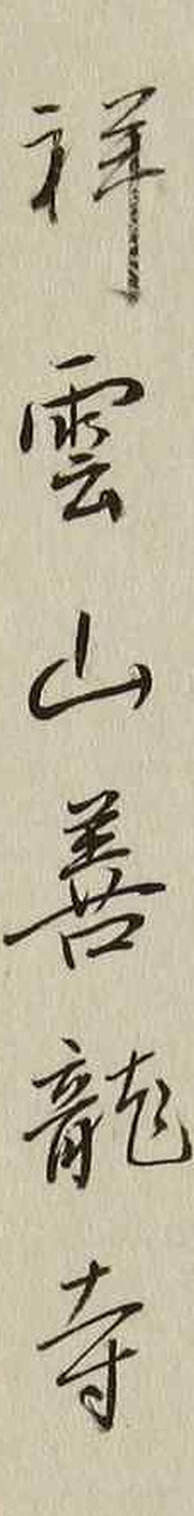祥雲山善龍寺
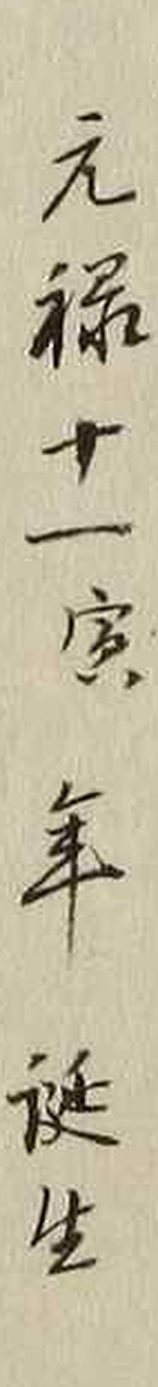元禄十一寅年誕生
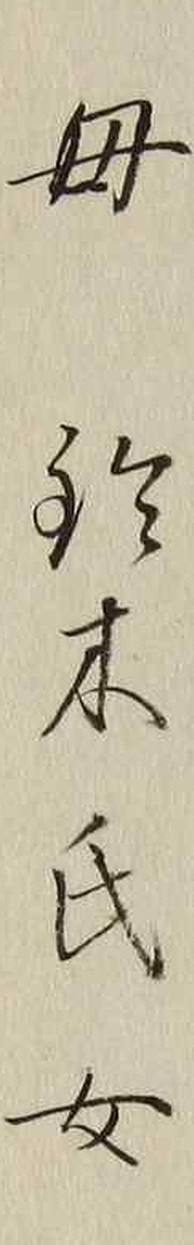母鈴木氏女
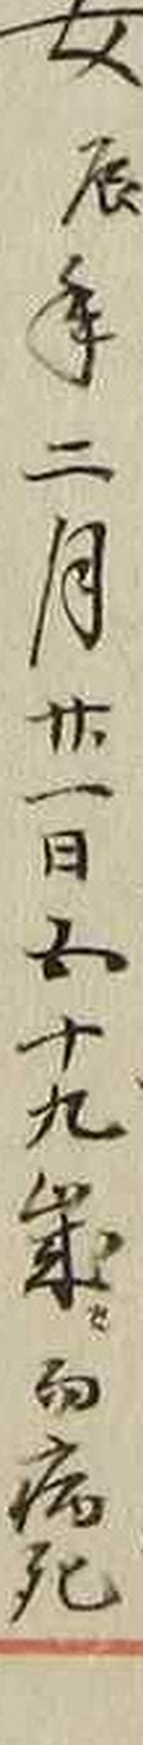辰年二月廿一日五十九歳ニ而病死
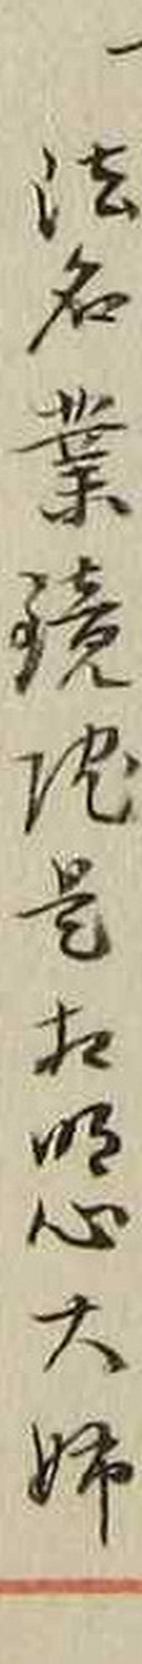法名業鏡院是相明心大姉
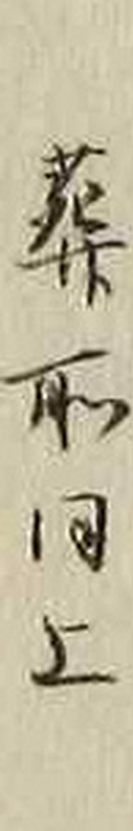葬所同上
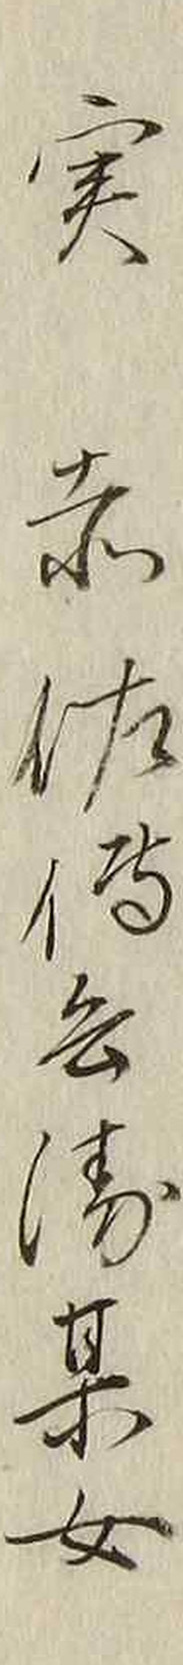実赤佐伝兵衛某女
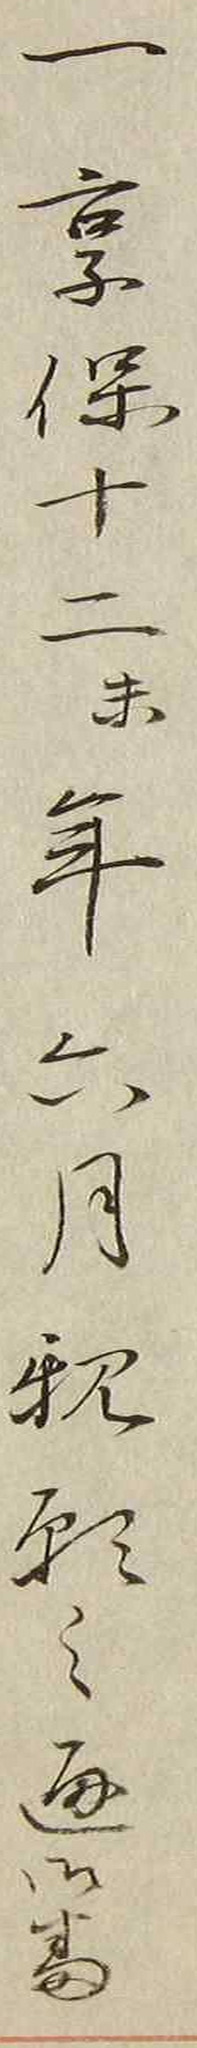一享保十二未年六月親願之通御番
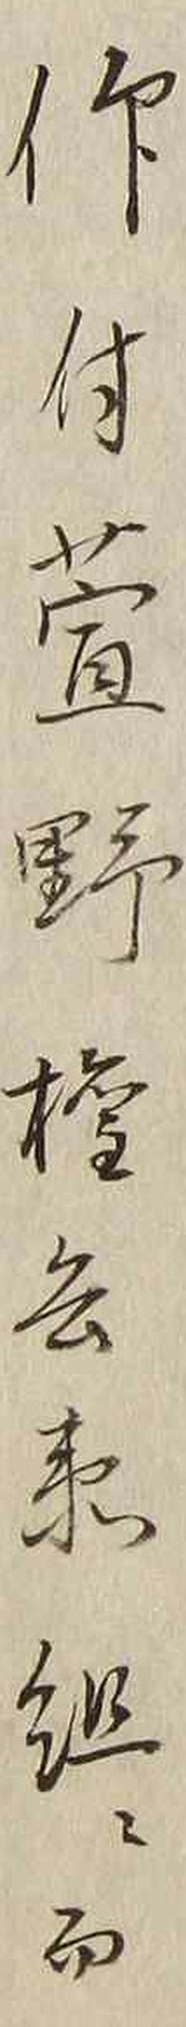被仰付萱野権兵衛組ニ而

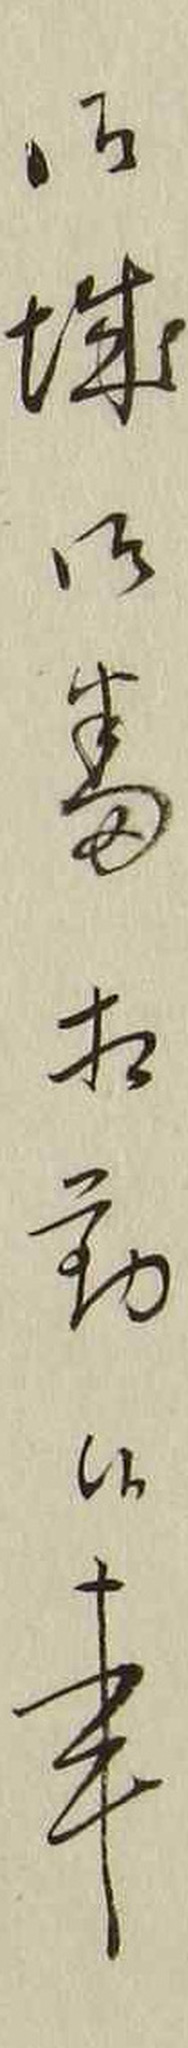御城御番相勤候事
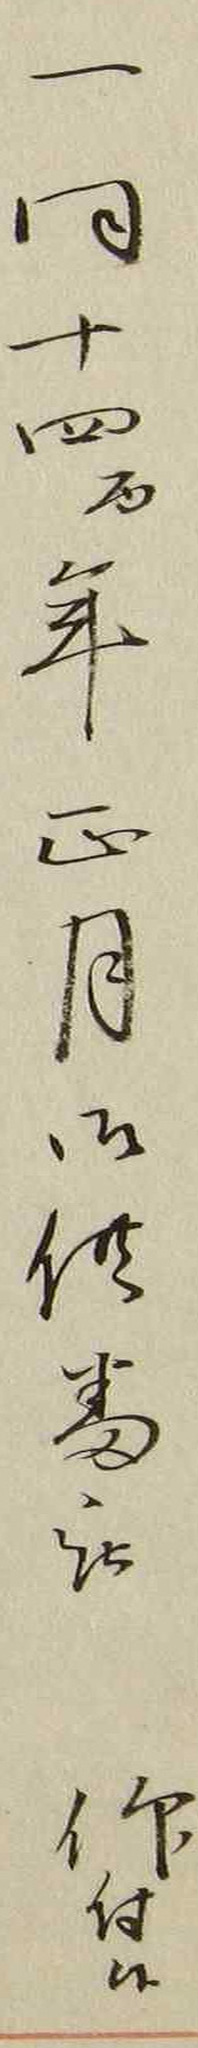一同十四酉年正月御供番被仰付候
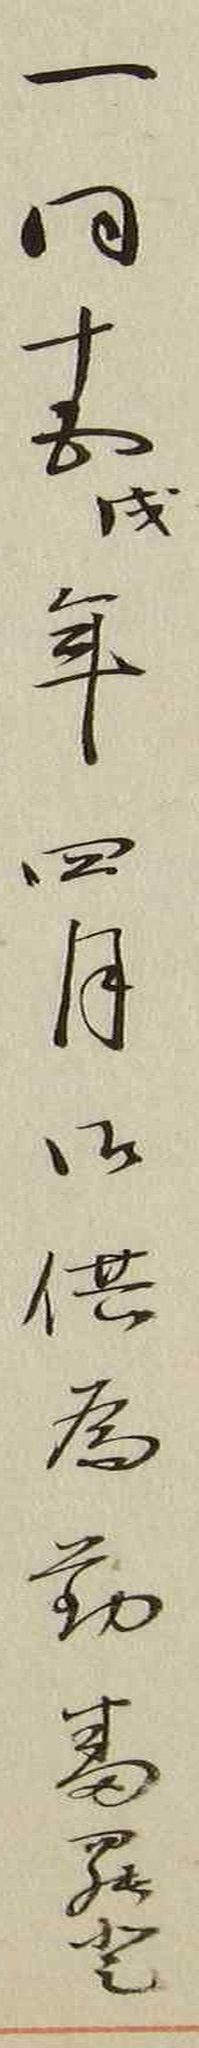一同十五戌年四月御供為勤番罷登
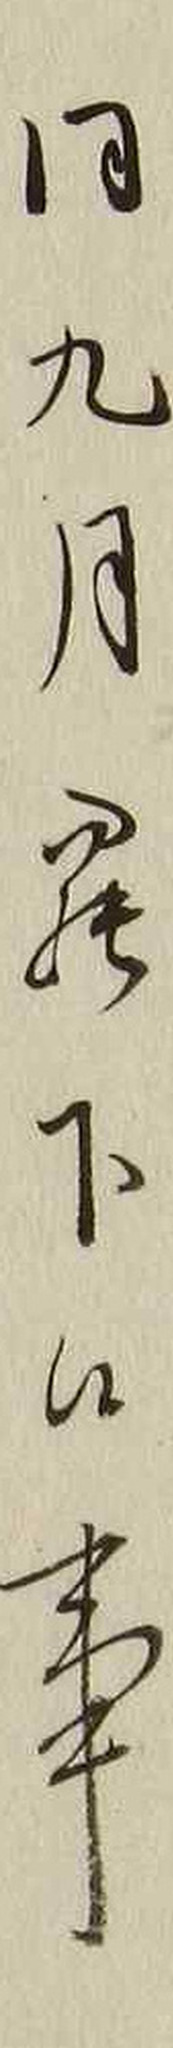同九月罷下候事
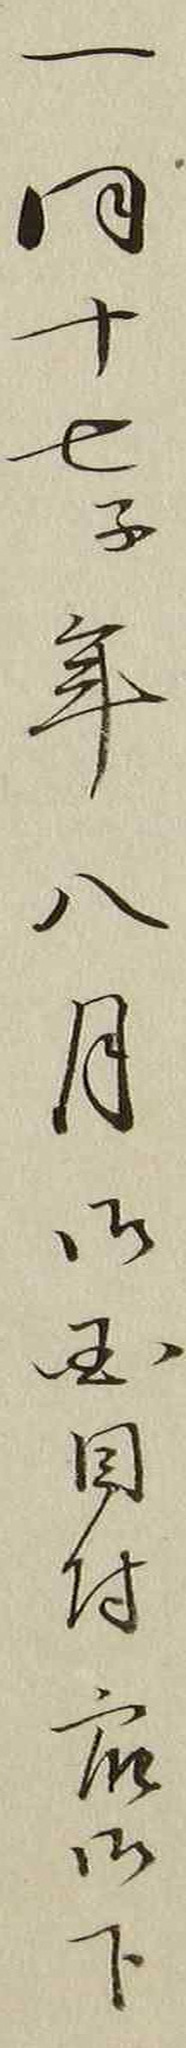一同十七子年八月御国目付衆御下
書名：諸士系譜　巻之22　い之部22
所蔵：会津若松市立会津図書館
